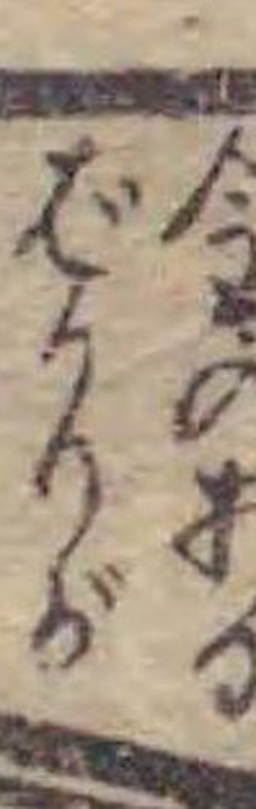ばかりが
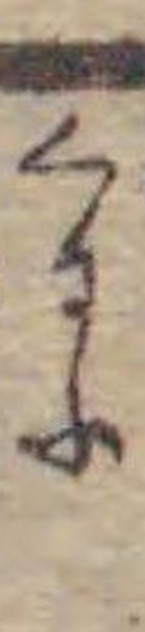くるふ
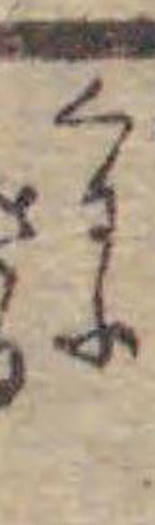くるふ
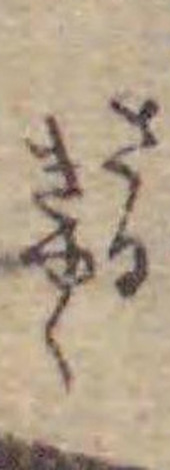きやく

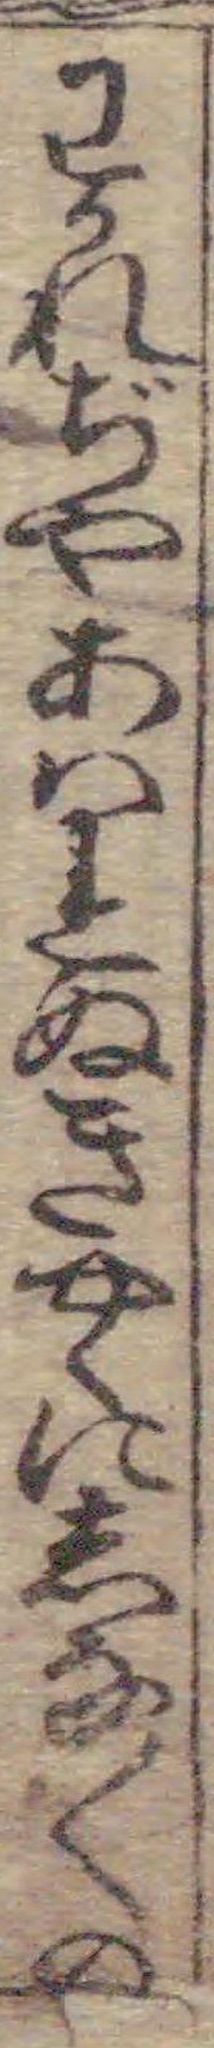わかれぢやあはれぬきやくにしな〳〵の
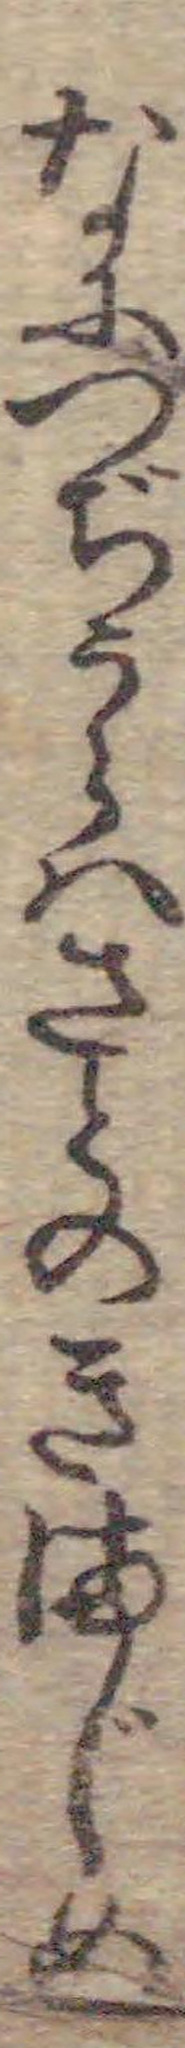なにつぢうらはさとのきまじめ
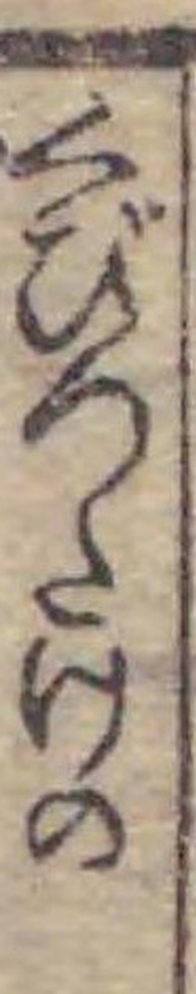くびつたけの
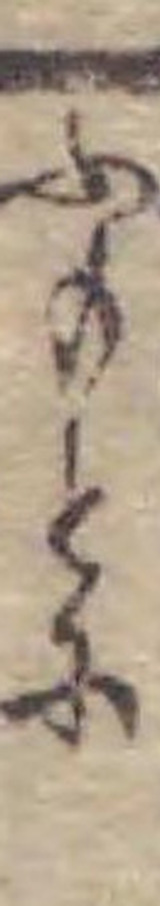ふもとに
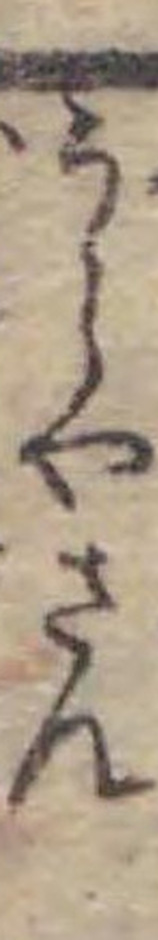うらやさん
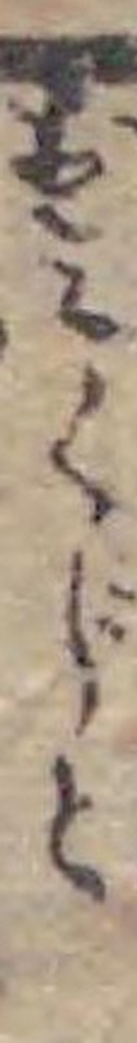おみくじと
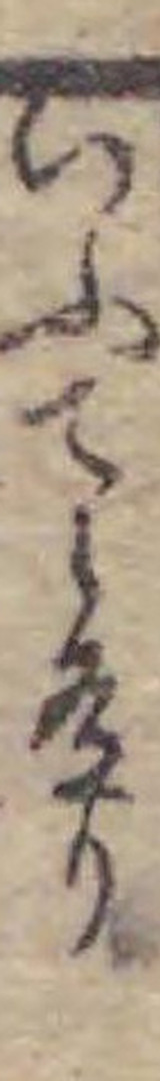いふてら有り
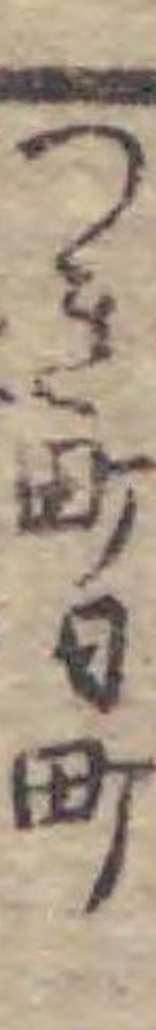つき町日町
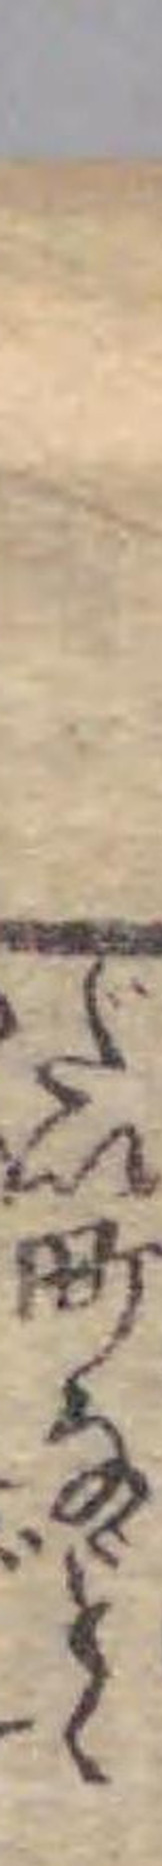だい町などゝ
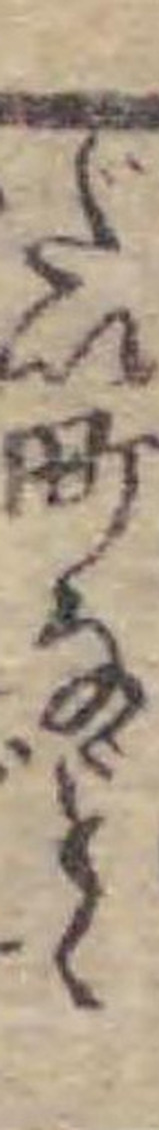だい町などゝ
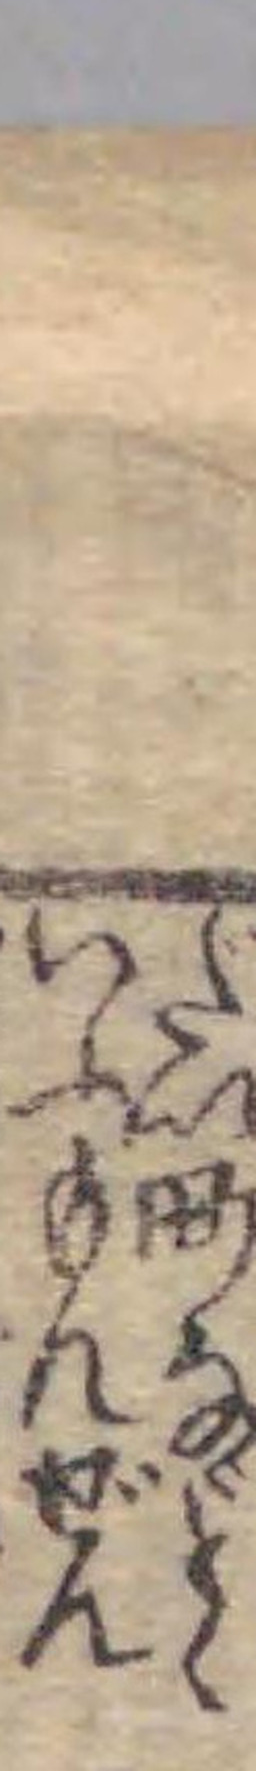いふもんぜん
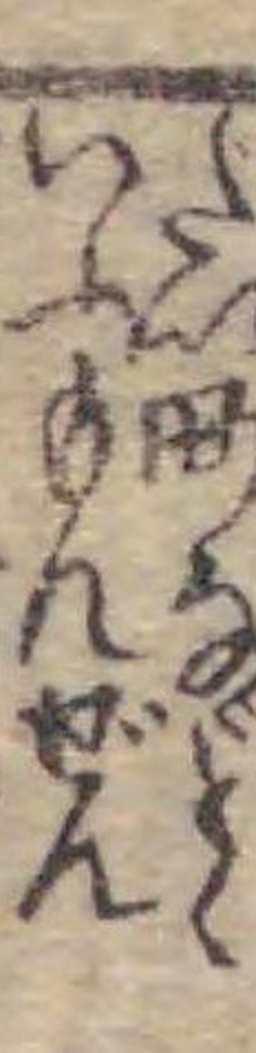いふもんぜん
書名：北国順礼唄方便 : 3巻
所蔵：国立国会図書館 National Diet Library, JAPAN
